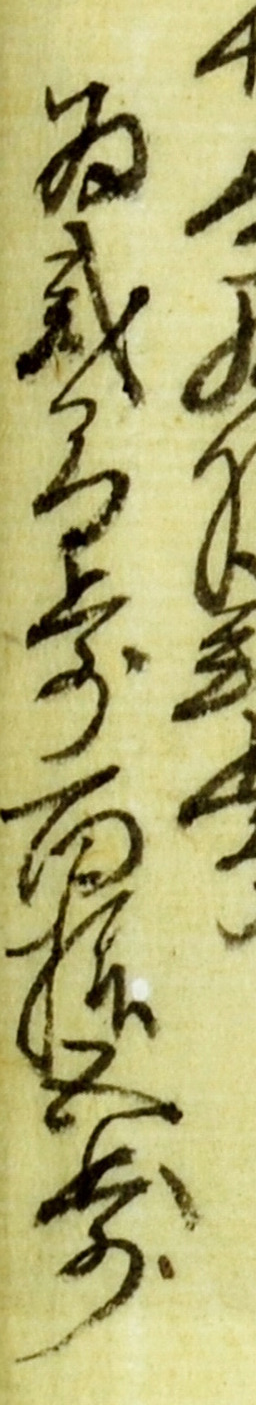為弐間歩百拾五歩
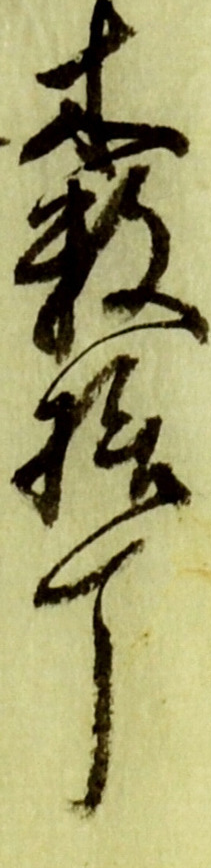木数拾丁
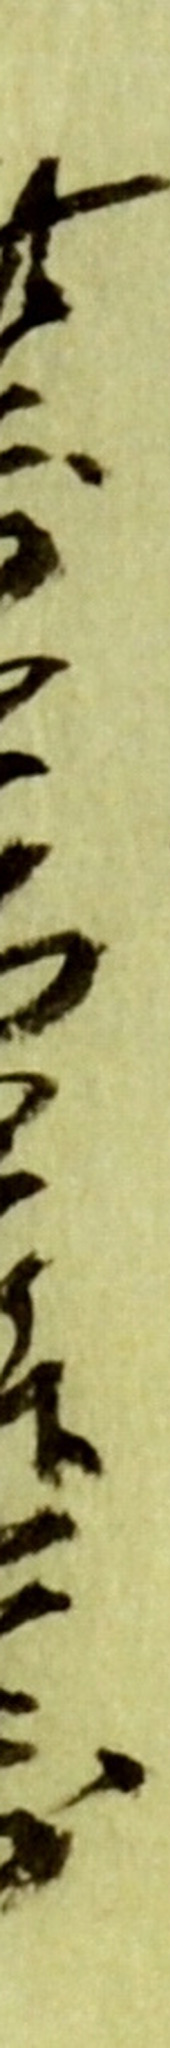惣〆此歩四百四拾六歩

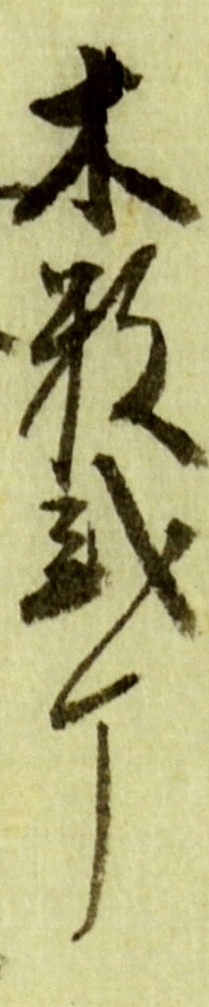木数弐丁
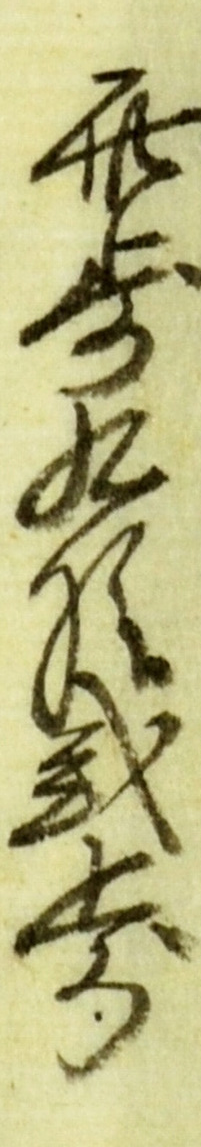〆此歩九拾弐歩
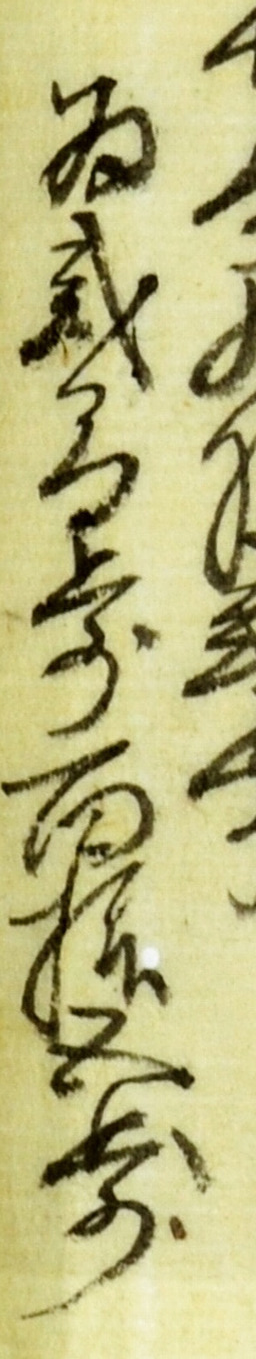為弐間歩百拾五歩
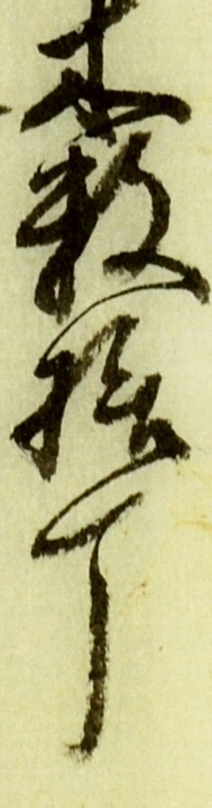木数拾丁
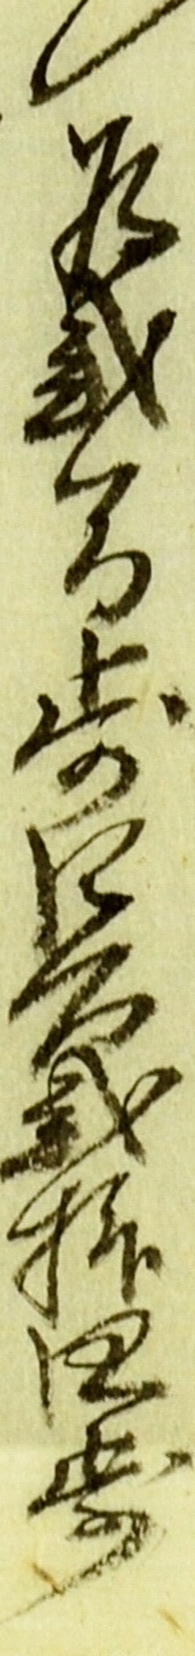為弐間歩四百弐拾四歩
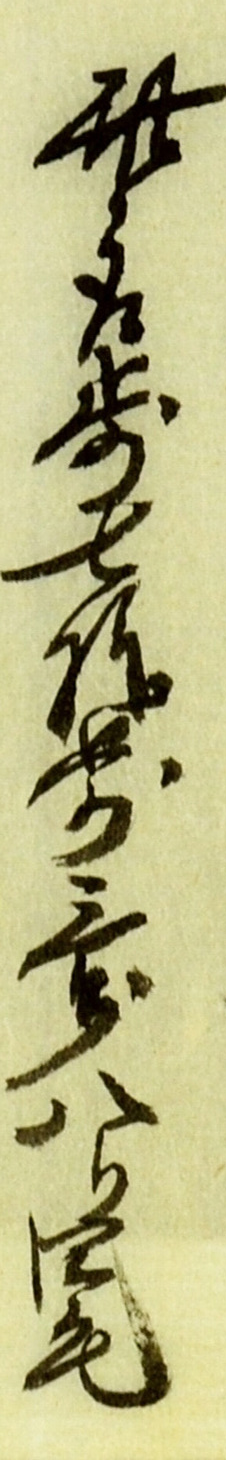此取歩七拾歩三分八厘四毛
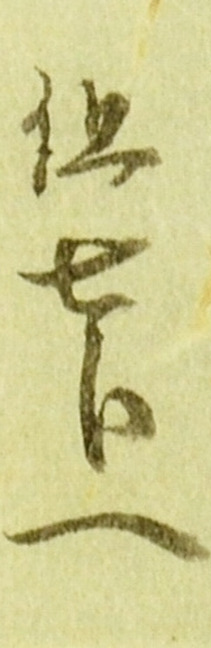但七分一
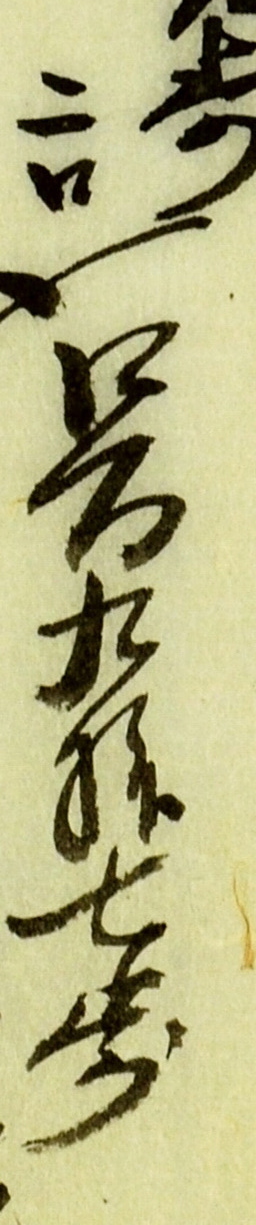二口〆四百九拾七歩
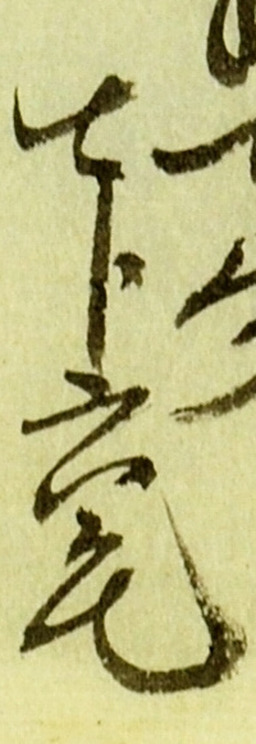七分六毛
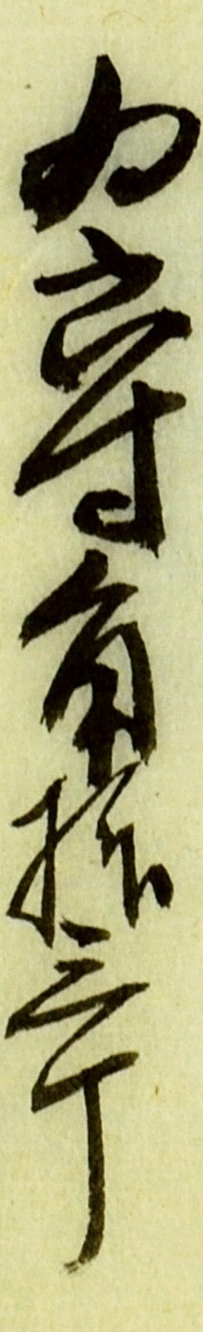為六寸角拾三丁
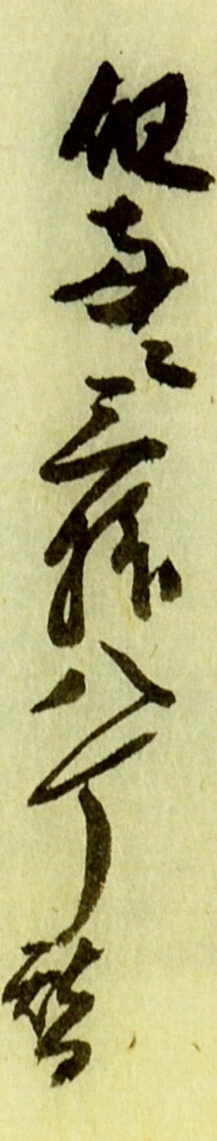但両ニ三拾八丁替
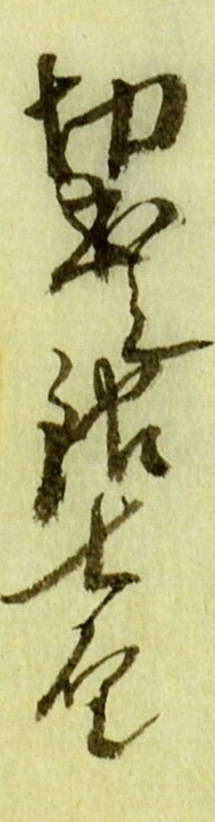切出シ銀七厘
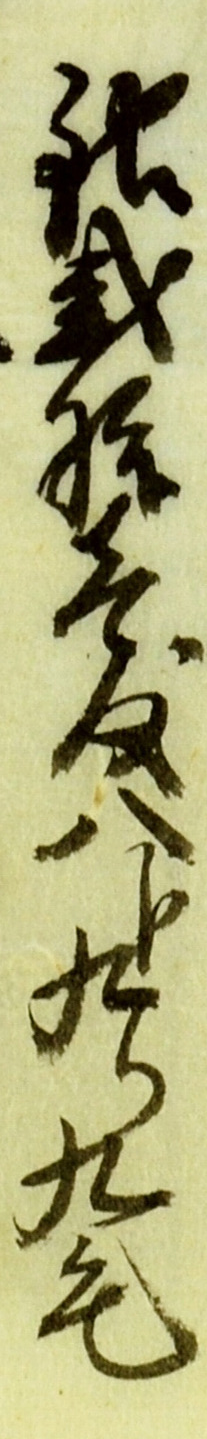銀弐拾壱匁八分九厘九毛
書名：材木川下ケ分一上納帳
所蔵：伊那市立高遠町図書館・合同会社AMANE
